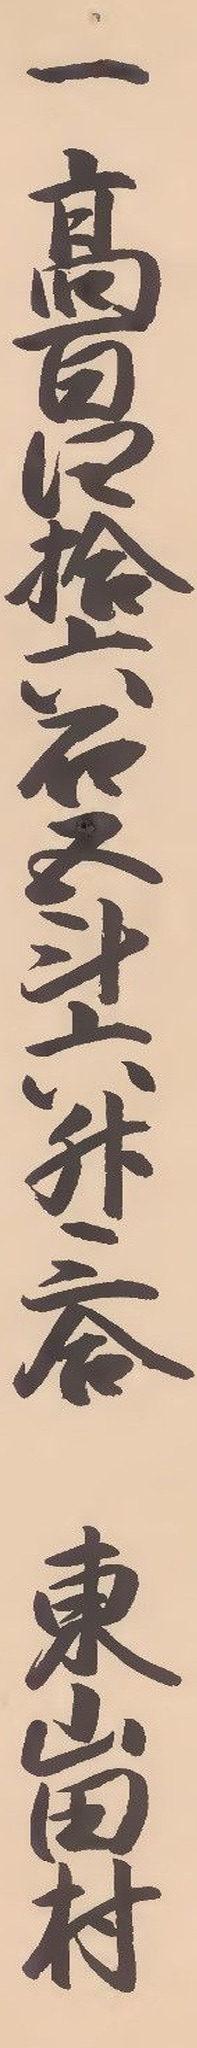一高百四拾六石五斗六升三合東山田村
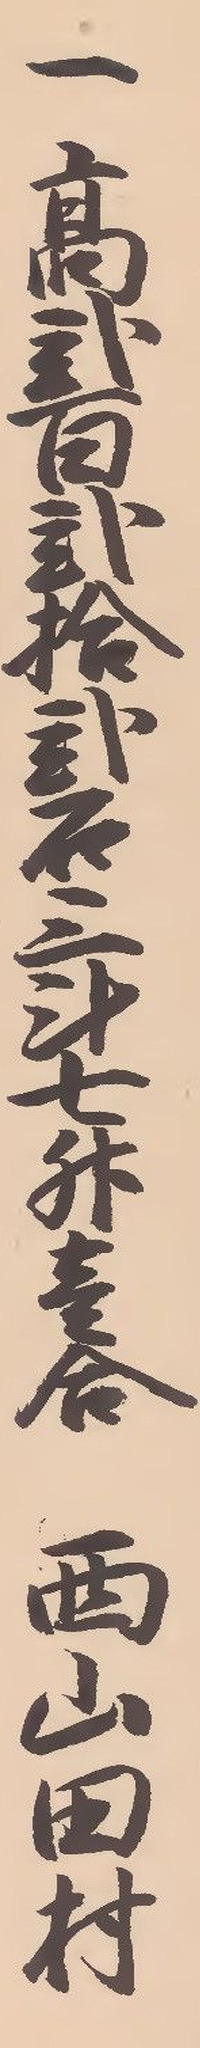一高弐百弐拾弐石三斗七升壱合西山田村
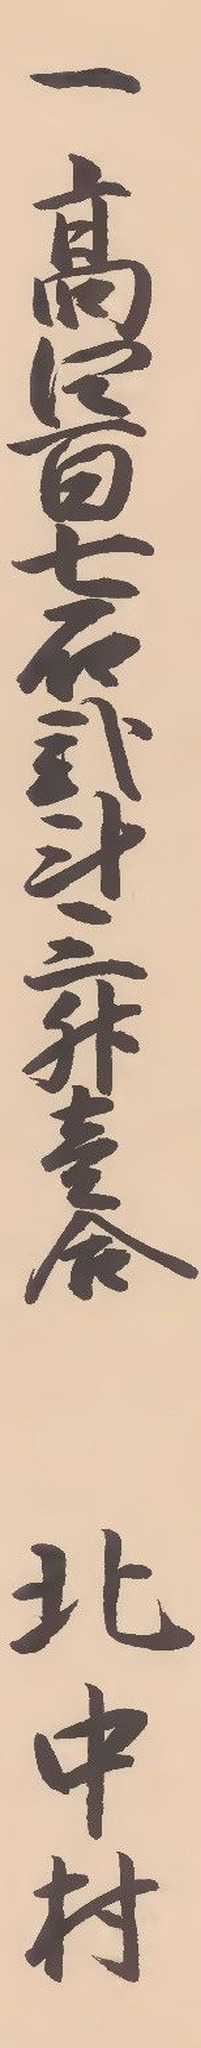一高四百七石弐斗三升壱合北中村
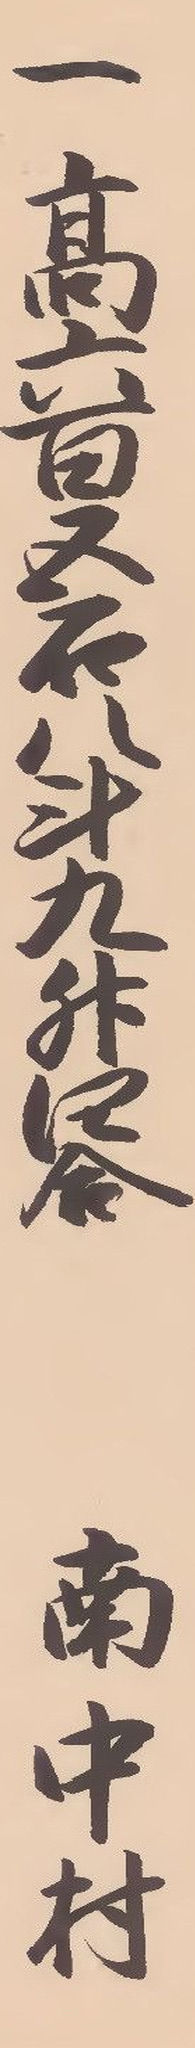一高六百五石八斗九升四合南中村
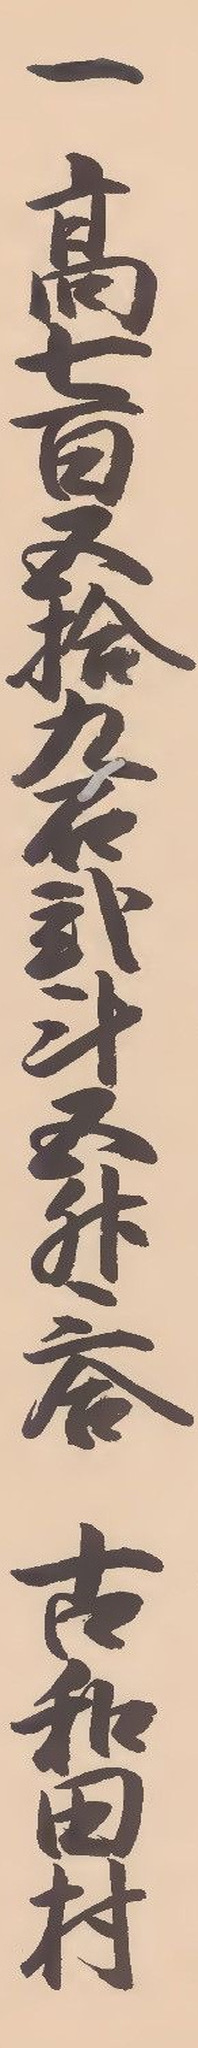一高七百五拾九石弐斗五升三合古和田村

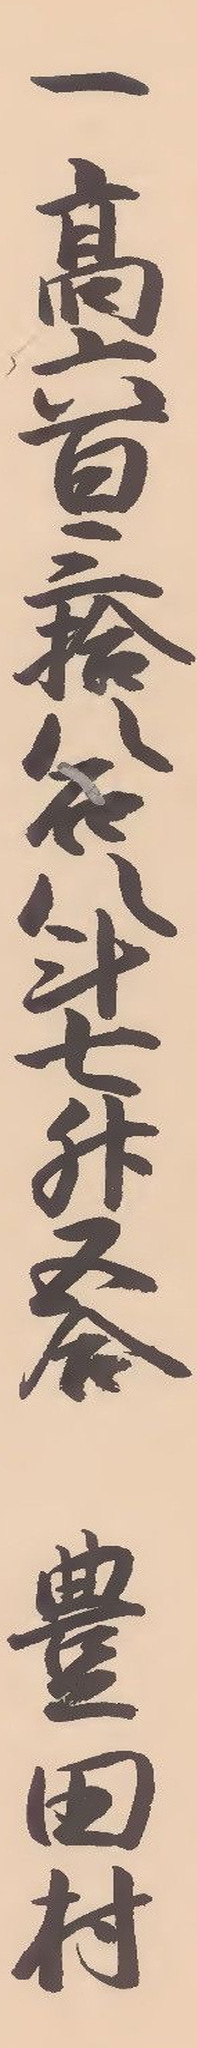一高六百三拾八石八斗七升五合豊田村
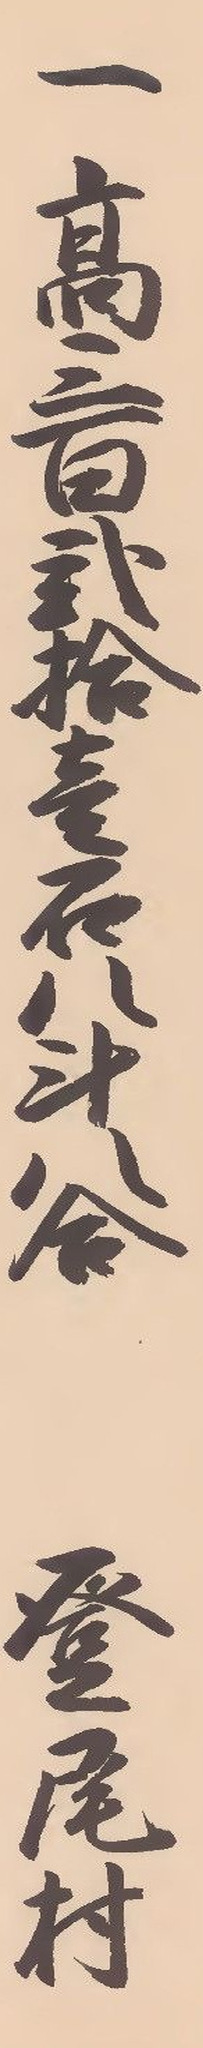一高三百弐拾壱石八斗八合登尾村
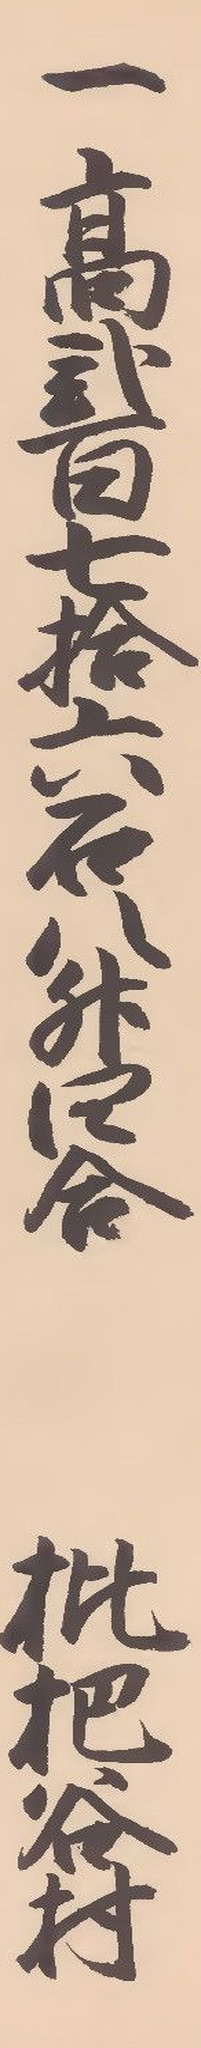一高弐百七拾六石八升四合枇杷谷村
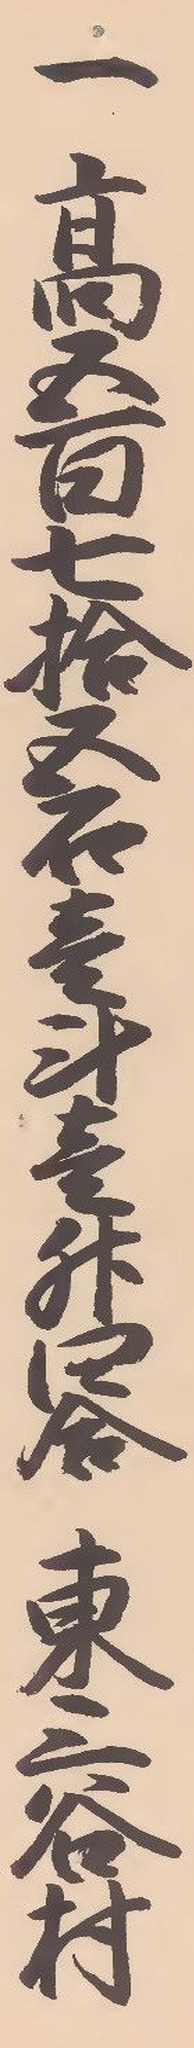一高五百七拾五石壱斗壱升四合東三谷村
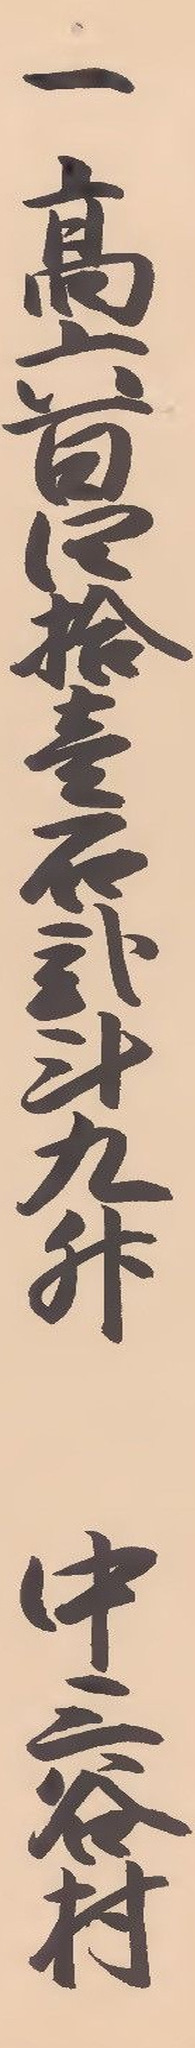一高六百四拾壱石弐斗九升中三谷村
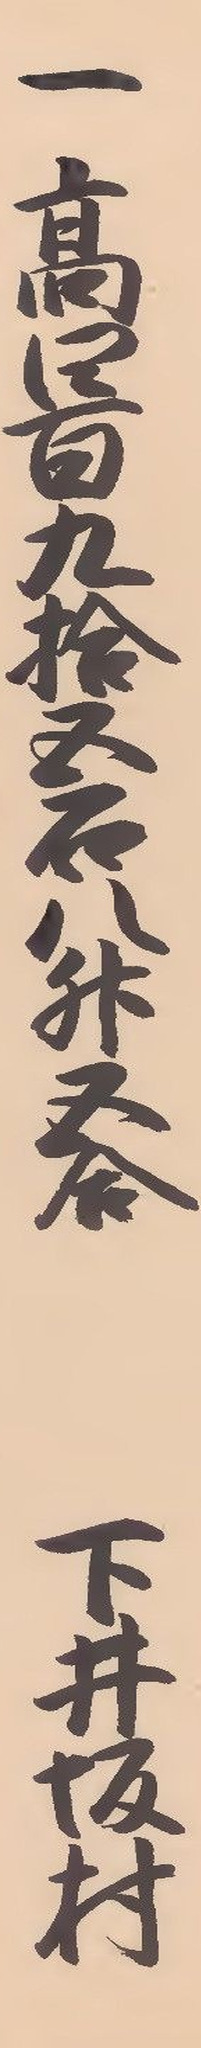一高四百九拾五石八升五合下井坂村
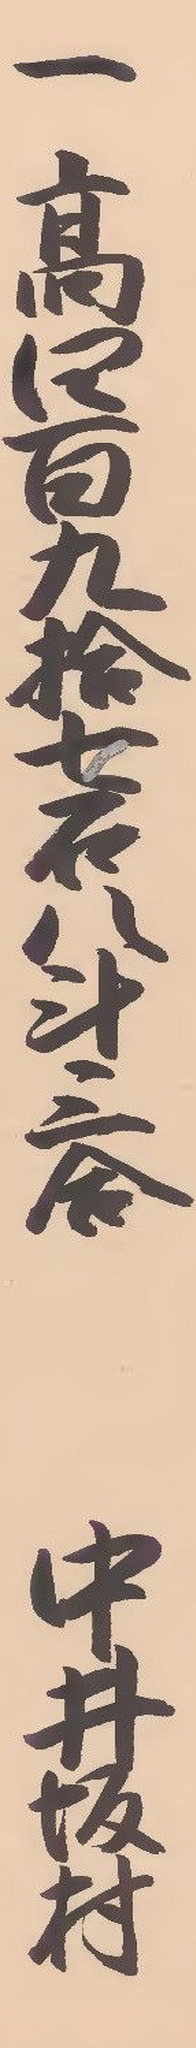一高四百九拾七石八斗三合中井坂村

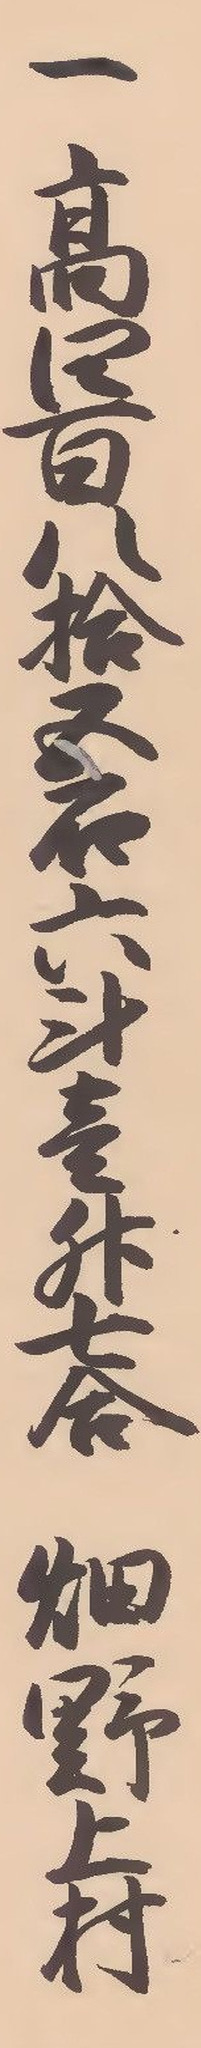一高四百八拾五石六斗壱升七合畑野上村
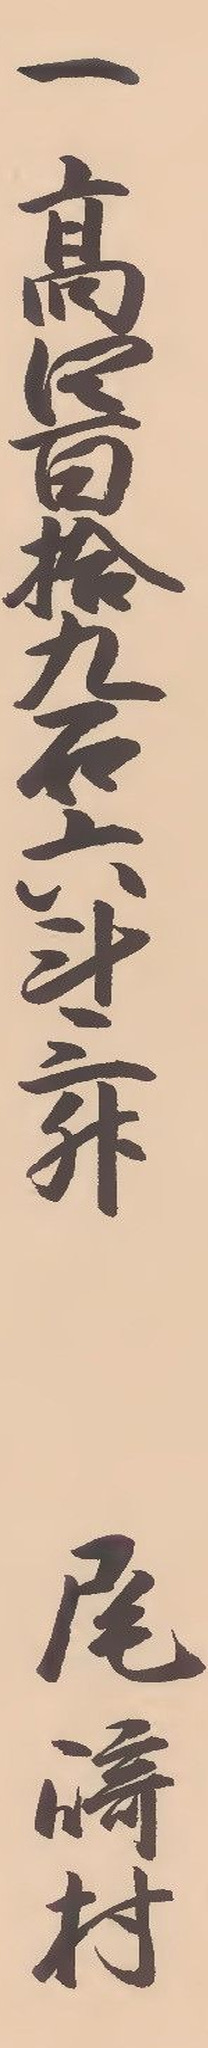一高四百拾九石六斗三升尾崎村
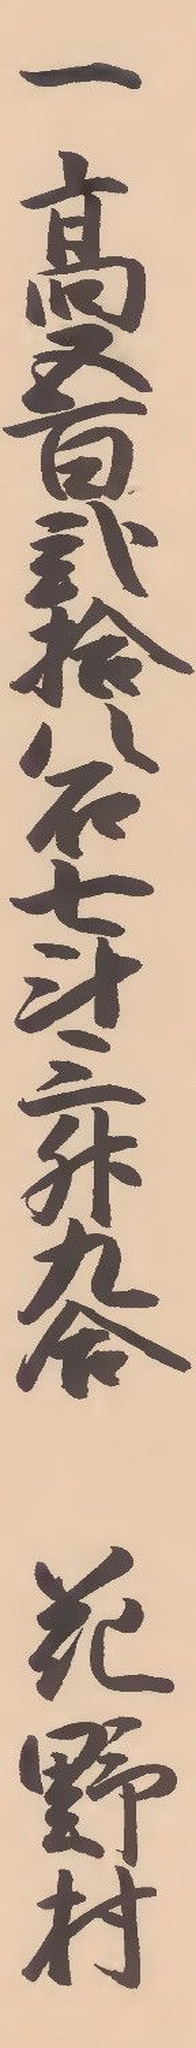一高五百弐拾八石七斗三升九合花野村
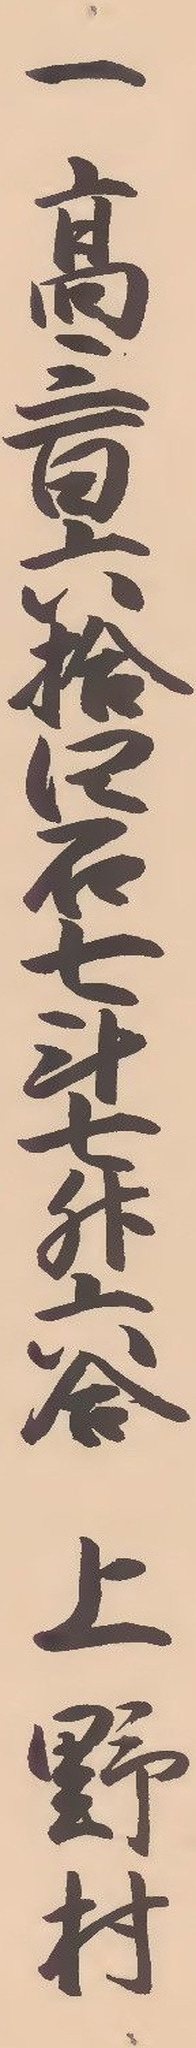一高三百六拾四石七斗七升六合上野村
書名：紀伊国郷帳
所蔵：国立公文書館 National Archives of Japan
